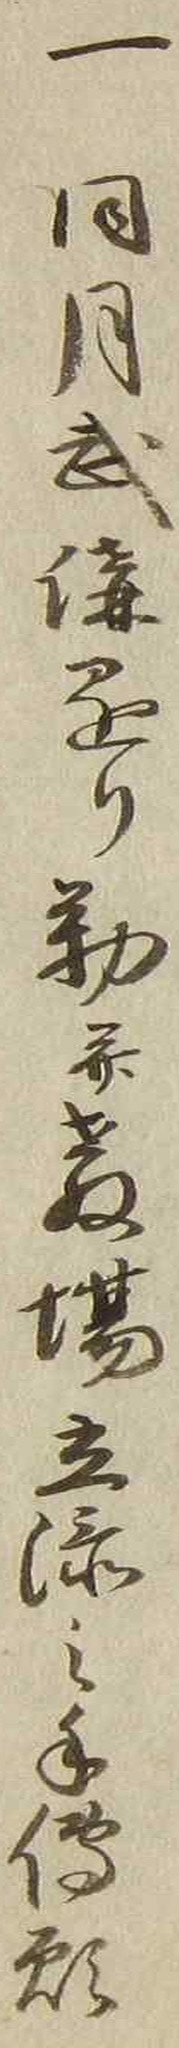一同月武講懸り勤并教場立添之手伝願
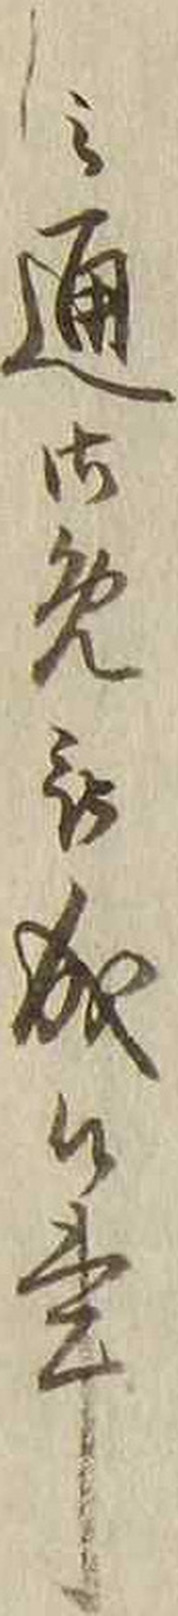之通御免被成候事

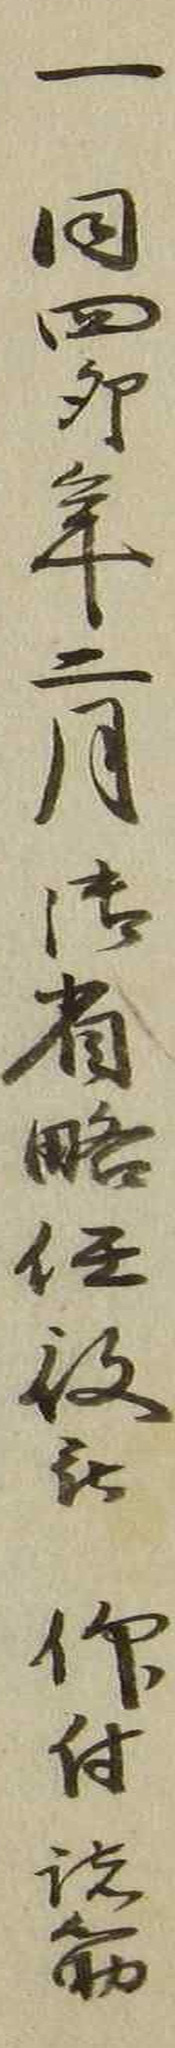一同四卯年二月御省略任役被仰付諸筋
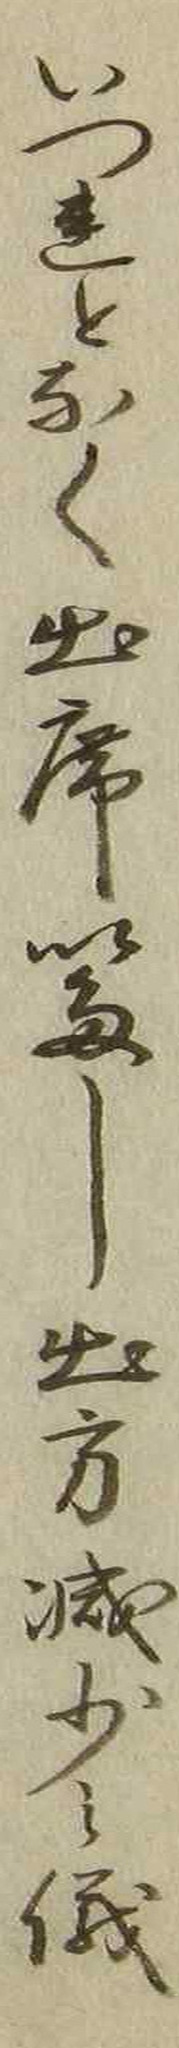いつれとなく出席いたし出方滅少之儀
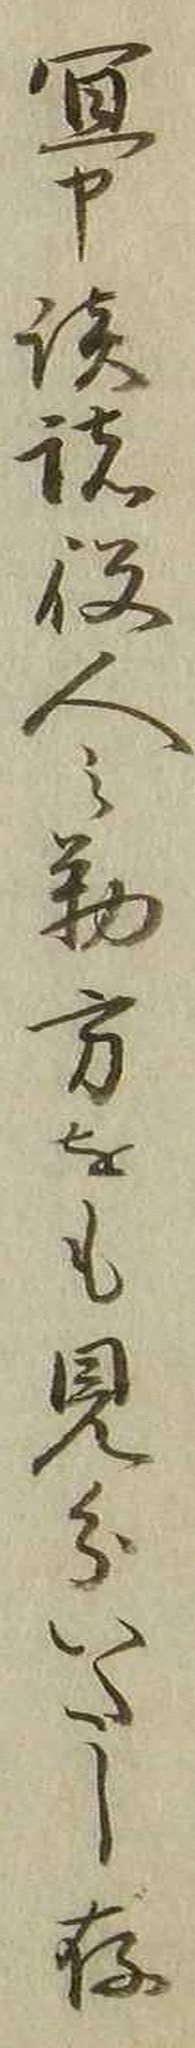宜申談諸役人之勤方をも見分いたし存
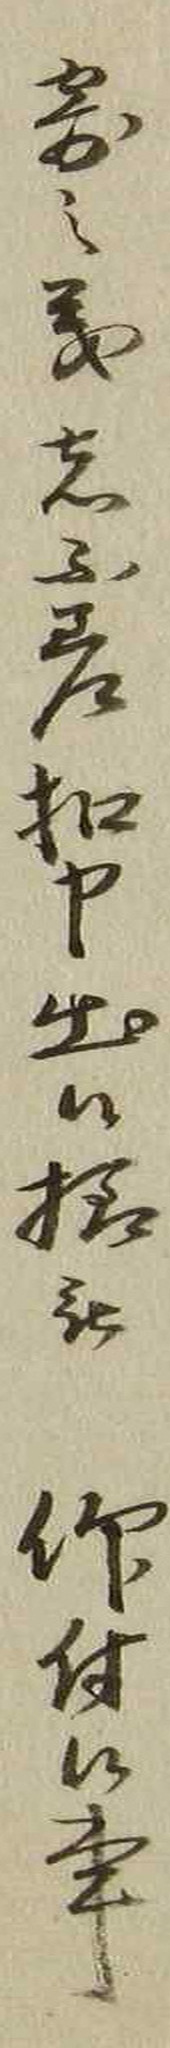寄之義は不差扣申出候様被仰付候事
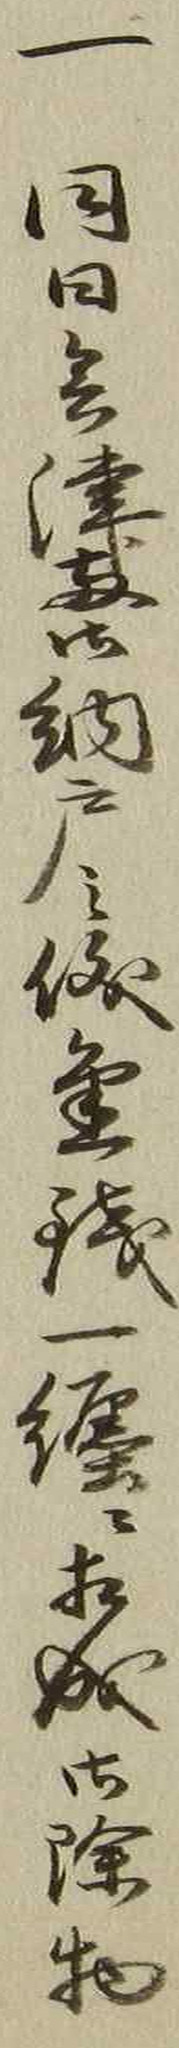一同日会津両御納戸之儀金銭一纏に相成御除物
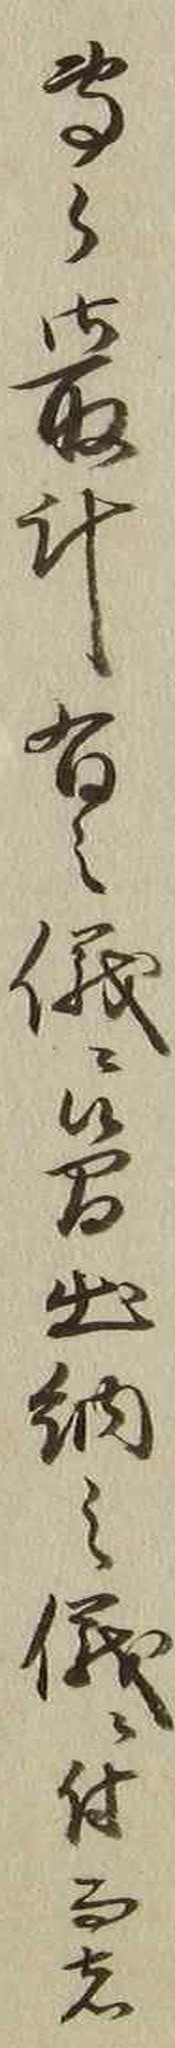専ら御取計有之儀に候間出納之儀に付而は
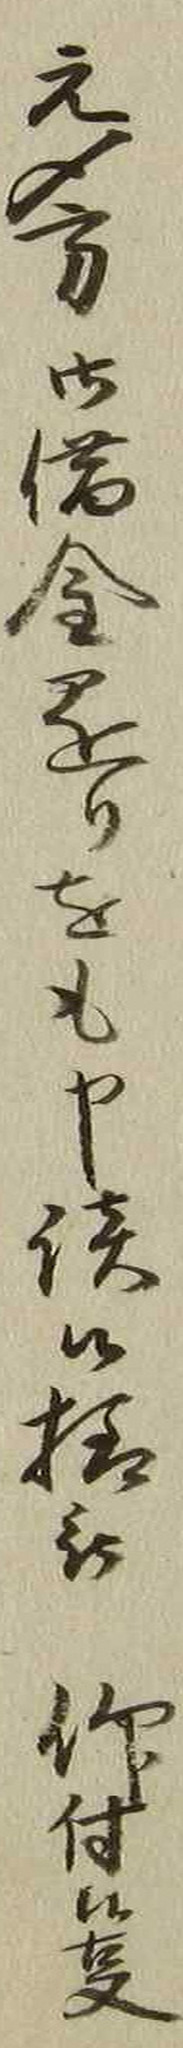元〆方御借金懸りをも申談候様被仰付候事
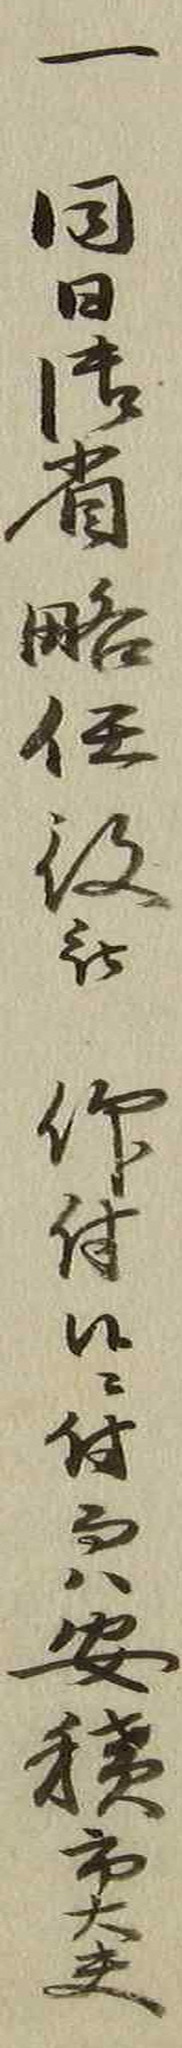一同日御省略任役被仰付候に付而は安積市太夫
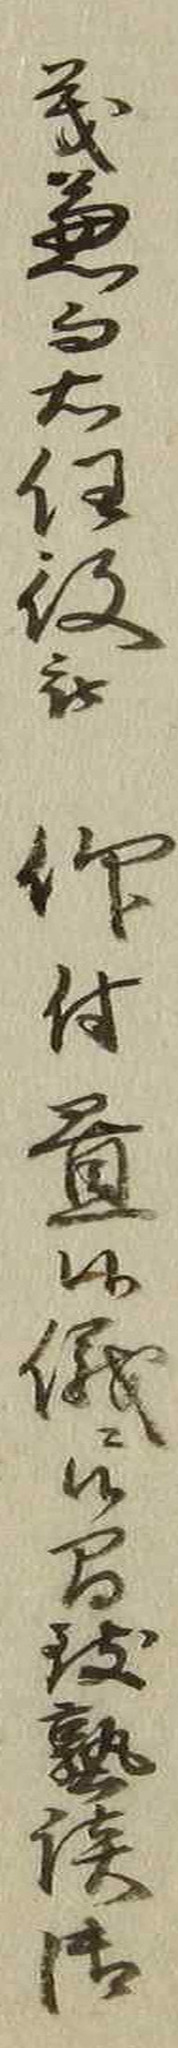義兼而右任役被仰付置候儀に候間致熟談御
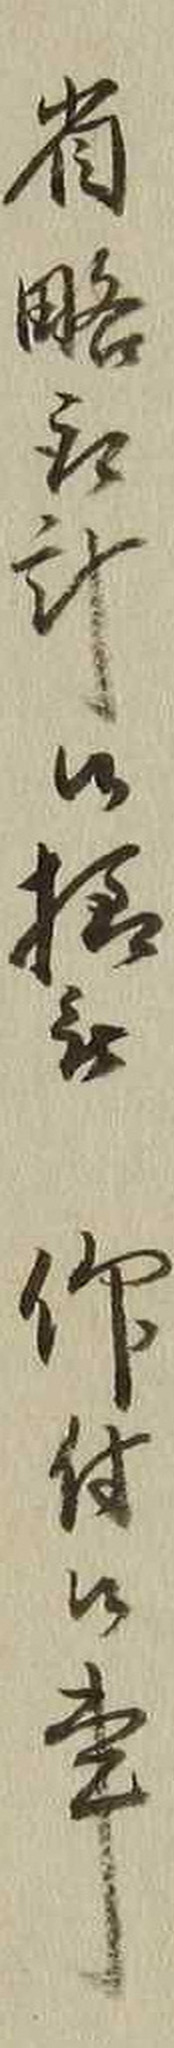省略取計候様被仰付候事
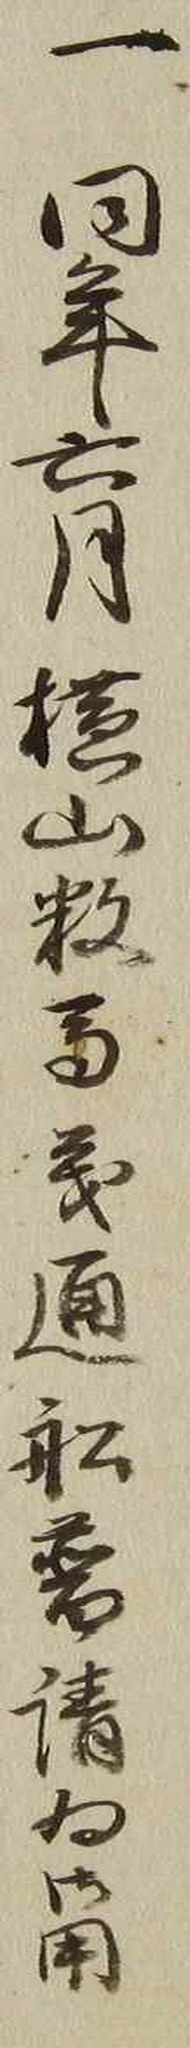一同年六月横山数馬義通船普請為御用
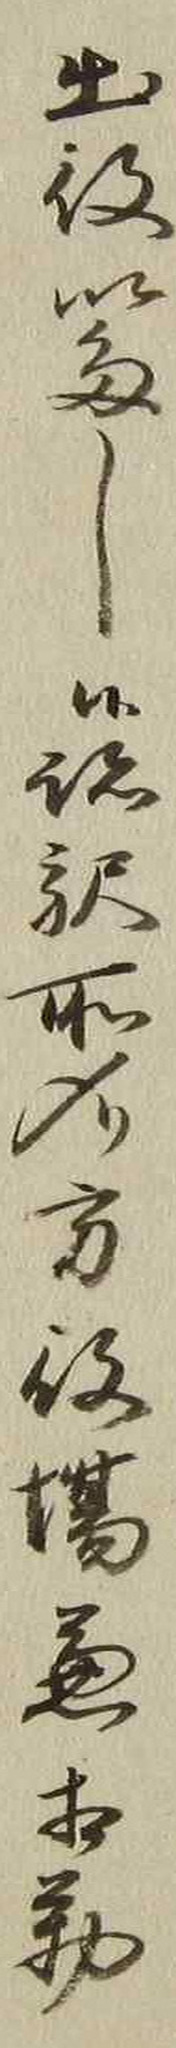出役いたし候跡駅所〆り方役場兼相勤
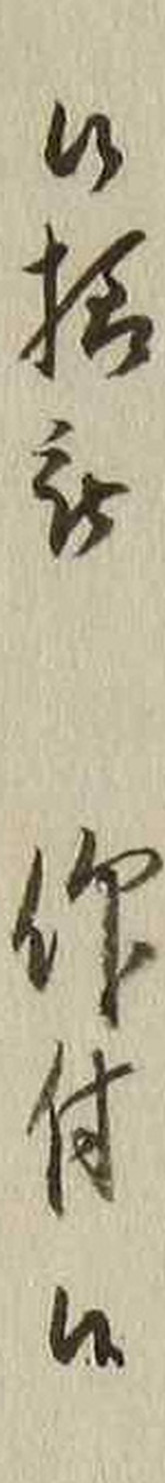候様被仰付候
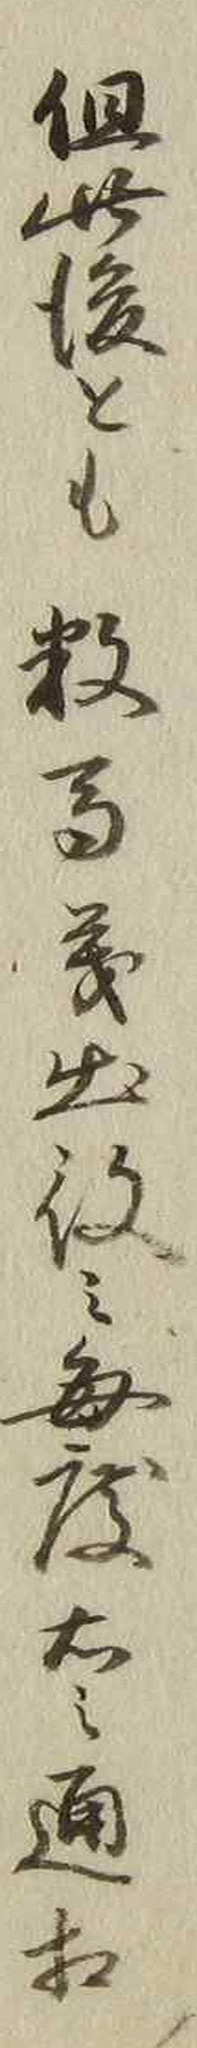但此後とも数馬義出役之毎度右之通相
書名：諸士系譜　巻之133　た之部9
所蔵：会津若松市立会津図書館
